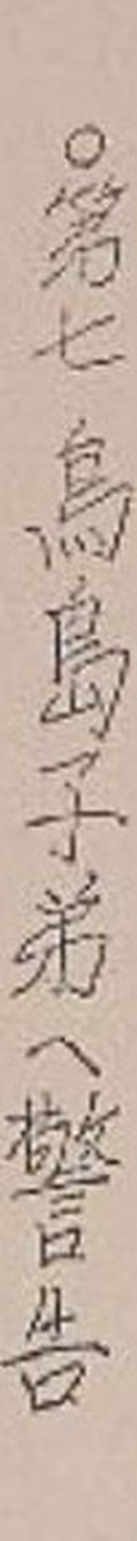○第七鳥島子弟へ警告
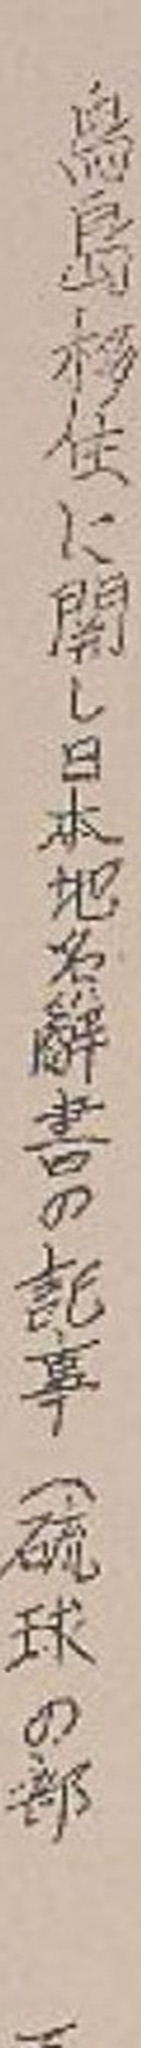鳥島移住に関し日本地名辞書の記事(硫球の部頁)

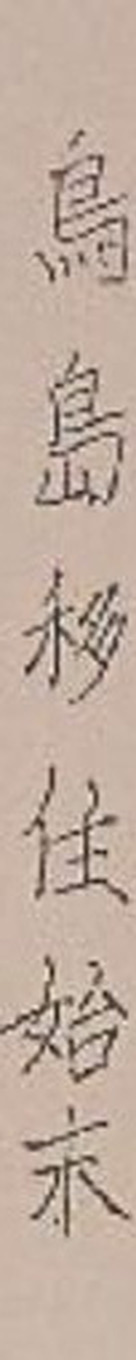鳥島移住始末
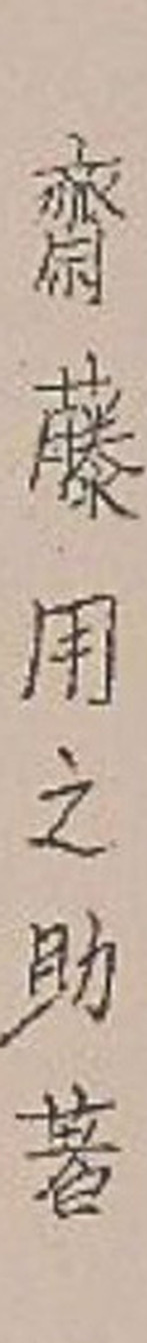斎藤用之助著
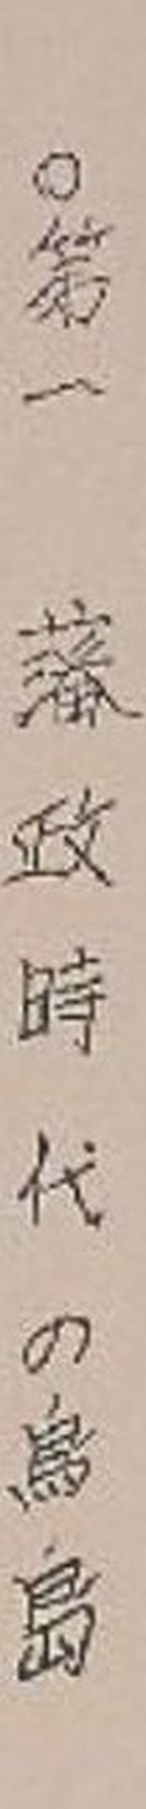○第一藩政時代の鳥島
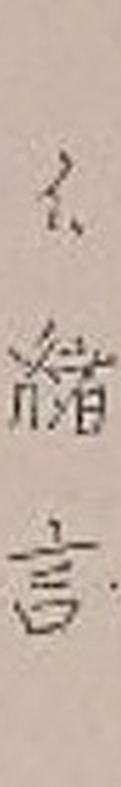イ緒言
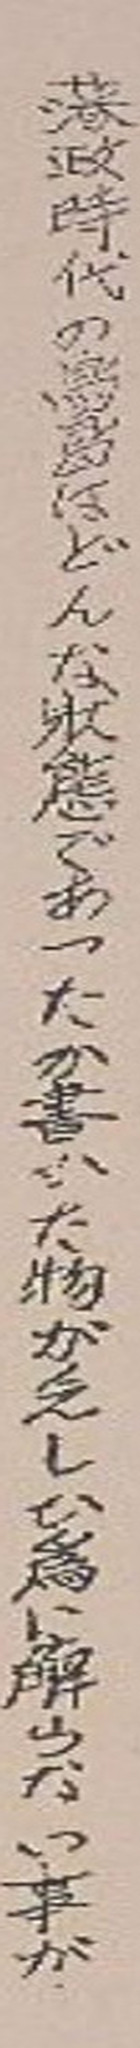藩政時代の鳥島はどんな状態であつたか書いた物が乏しひ為に解らない事が
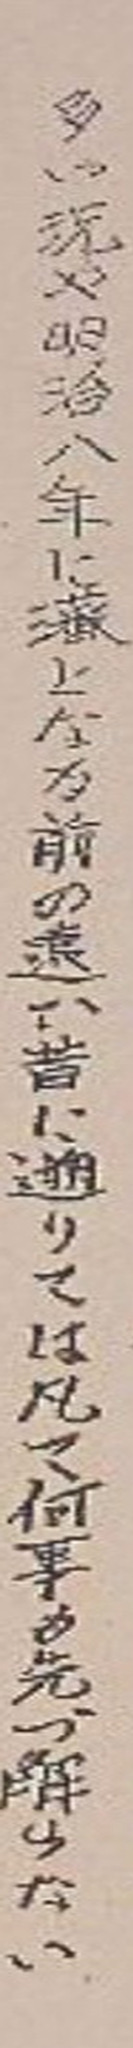多い況や明治八年に藩となる前の遠ひ昔に遡りては凡て何事も先づ解らない
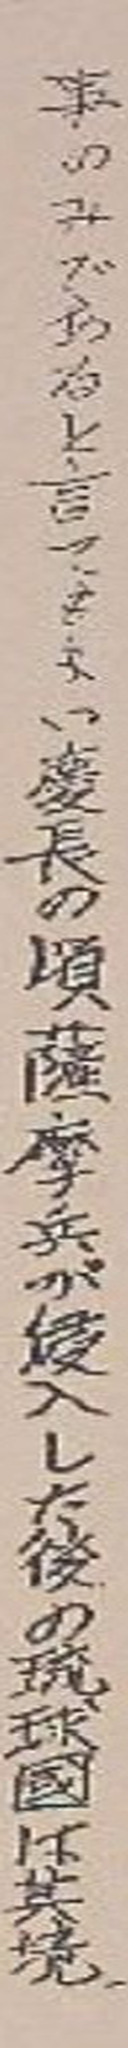事のみであると言てもよい慶長の頃薩摩兵が侵入した後の琉球国は其境
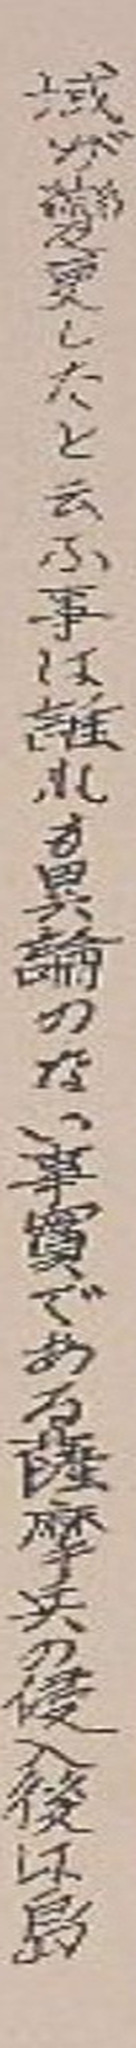域が変更したと云ふ事は誰れも異論のない事実である薩摩兵の侵入後は島
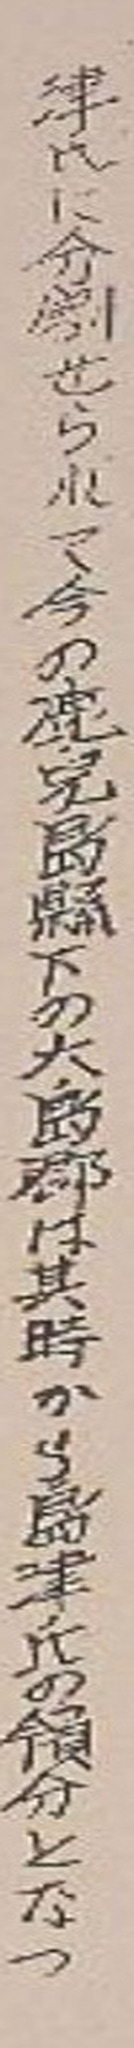津氏に分割せられて今の鹿児島県下の大島郡は其時から島津氏の領分となつ
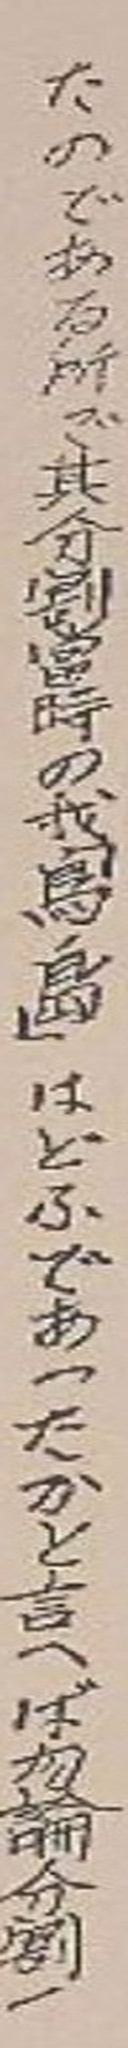たのである所で其分割当時の我「鳥島」はどふであったかと言へば勿論分割
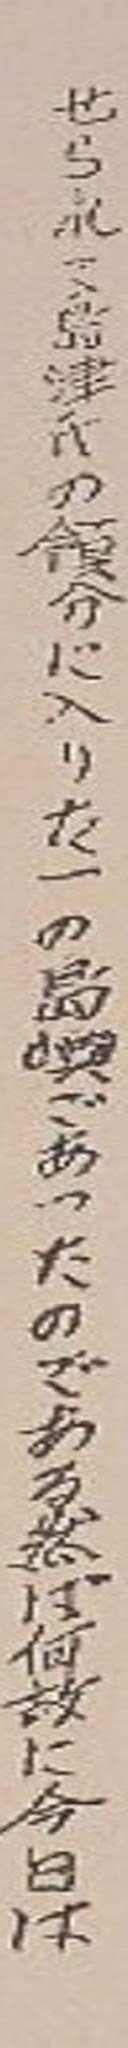せられて島津氏の領分に入りたての島嶼であったのである然ば何故に今日は
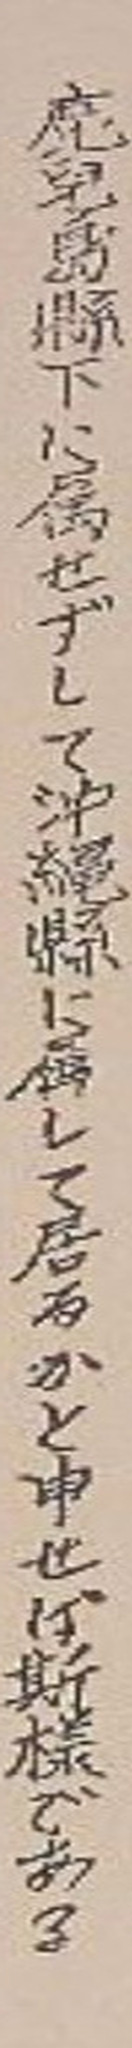鹿児島県下に属せずして沖縄県に属して居るかと申せば斯様である
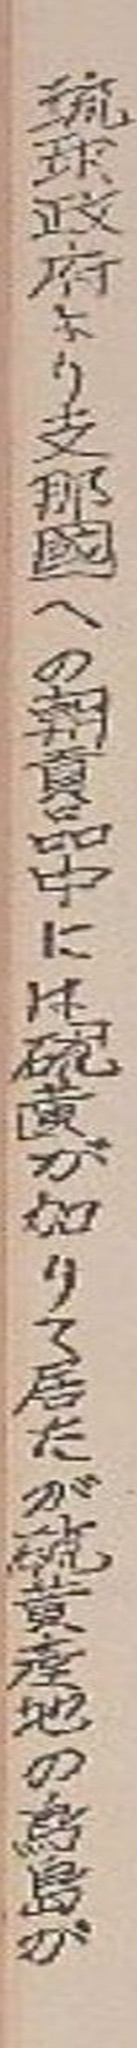琉球政府より支那国への朝貢品中には「硫黄」が加りて居たが硫黄産地の鳥島が
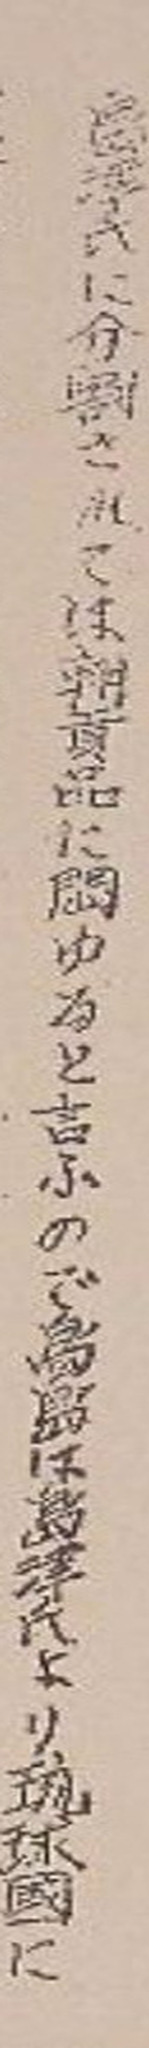島津氏に分割されては朝貢品に閊ゆると言ふので鳥島は島津氏より琉球国に
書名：鳥島移住始末
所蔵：University of the Ryukyus Library
